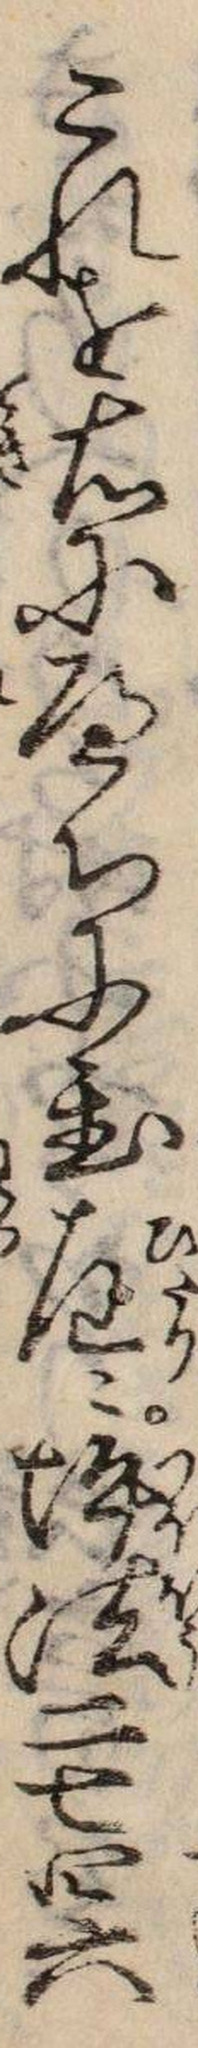これを右にへちに置左に坪法二七四六
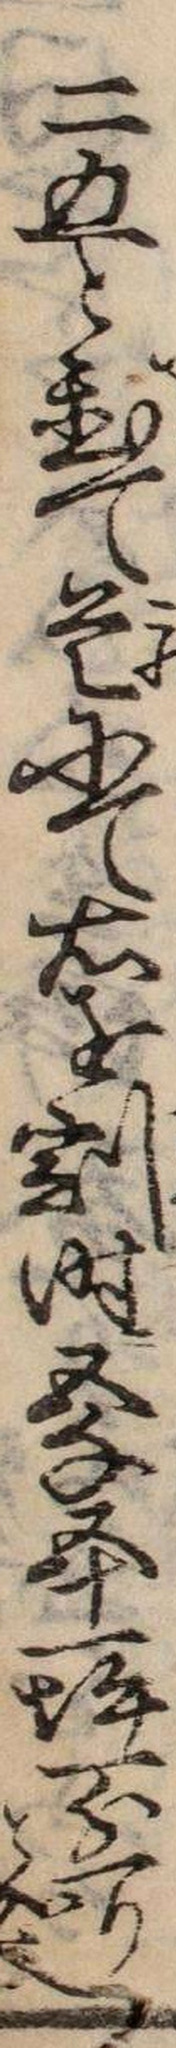二五と置て是にて右を割時五千五十一分一り成也

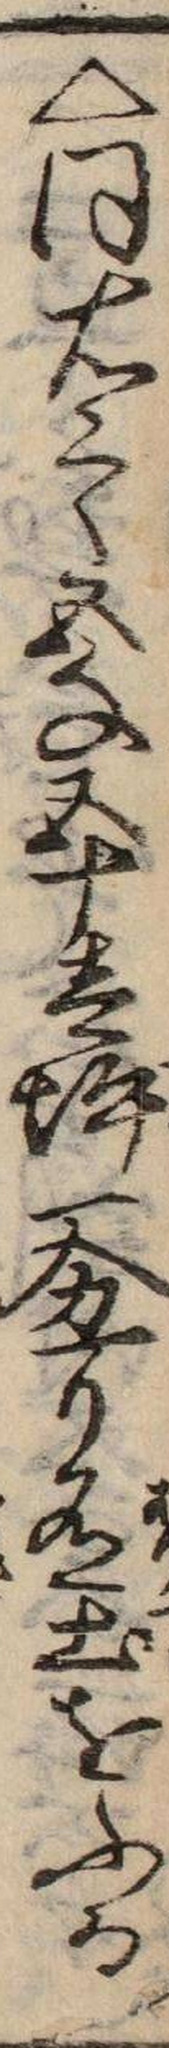△同右之五千五十壱坪一分一分り有土をふる
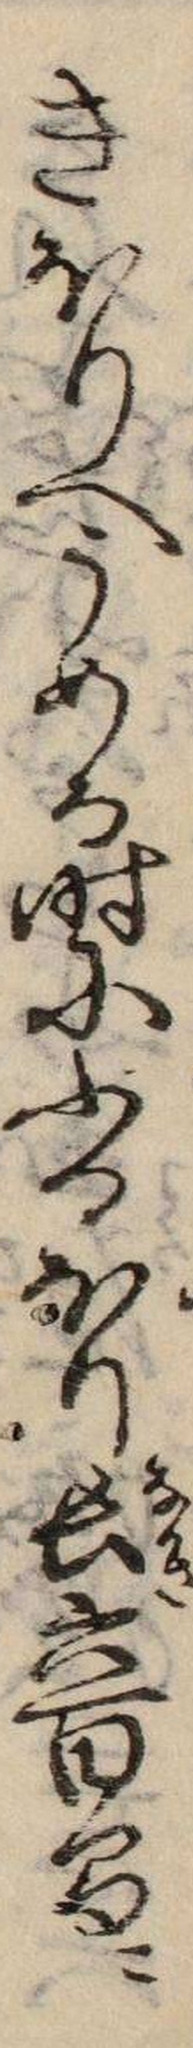きほりへうめる時にふつほり長六百間に
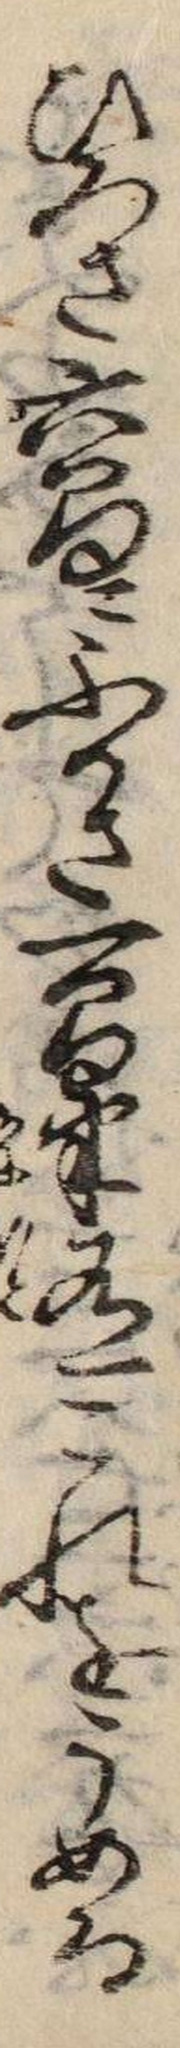ひろさ六間にふかさ一間半有これをうめる
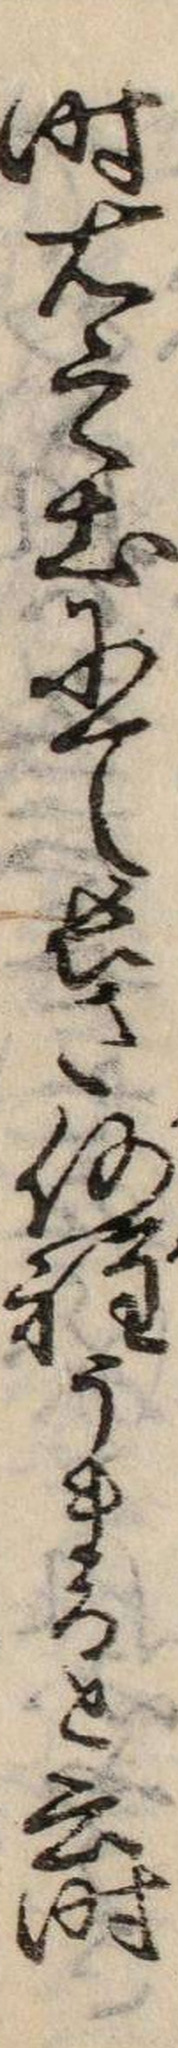時右之土にて長さ何程うまると云時
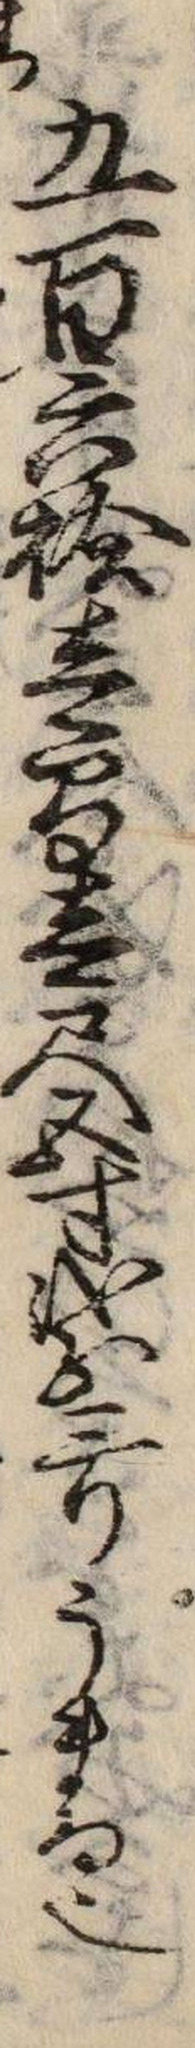五百六拾壱間壱尺五寸弐分三りうまる也
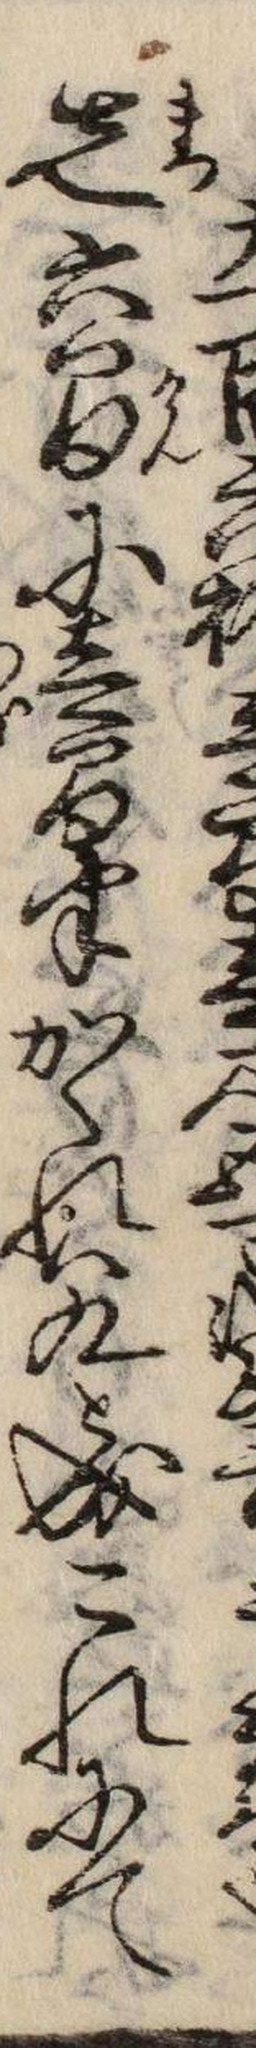先六間に壱間半かくれは九と成これにて
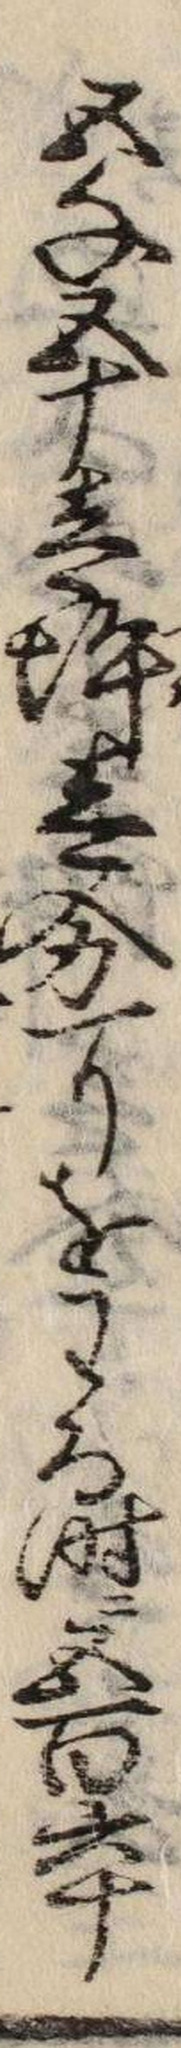五千五十壱坪壱分一りをわる時に五百六十
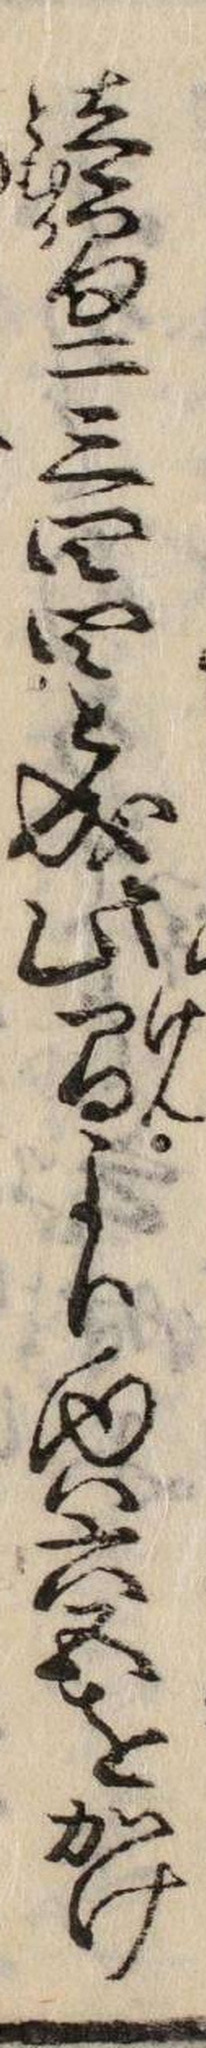壱両二三四四と成此間より内は六五をかけ
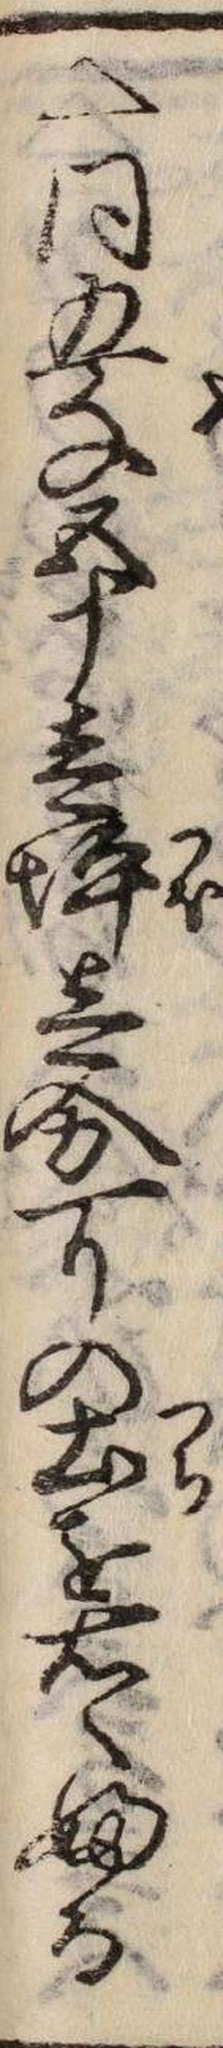△同五千五十壱坪壱分一りの土を右之ふる
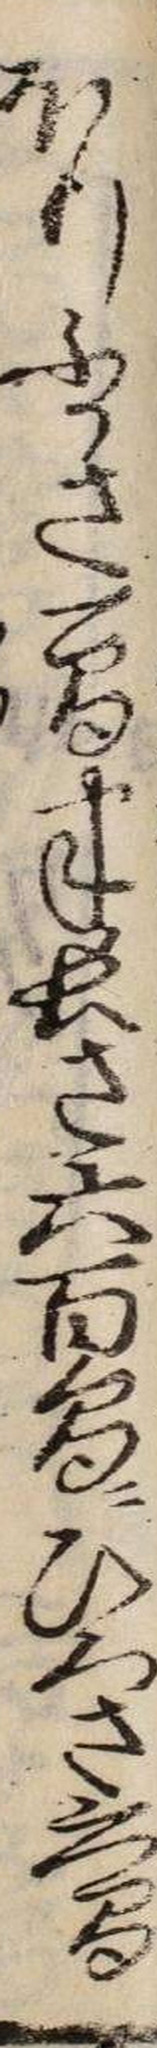ほりふかさ一間半長さ六百間にひろさ六間
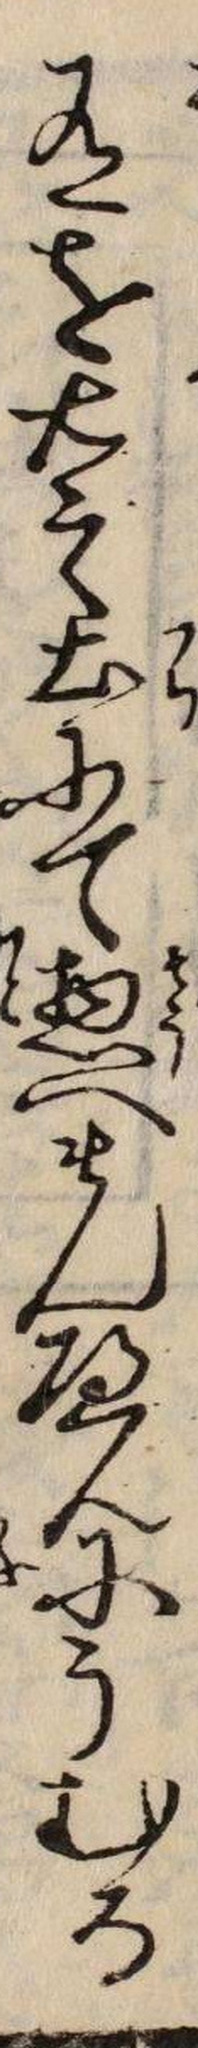有を右之土にて惣へまんへんにうむる
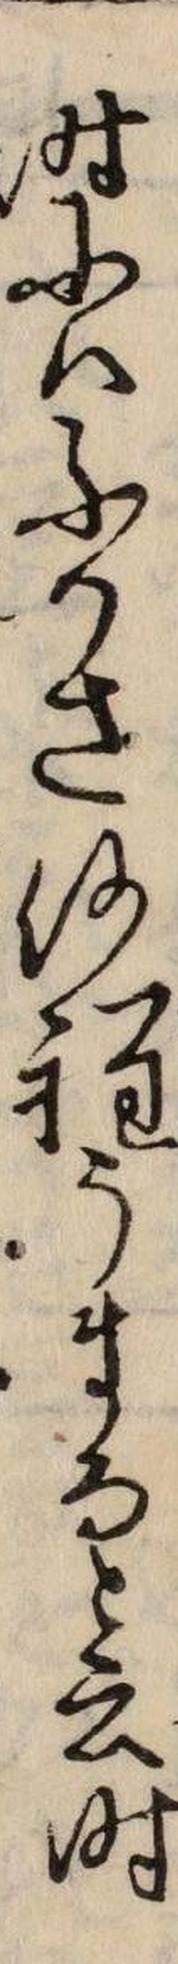時にはふかさ何程うまると云時
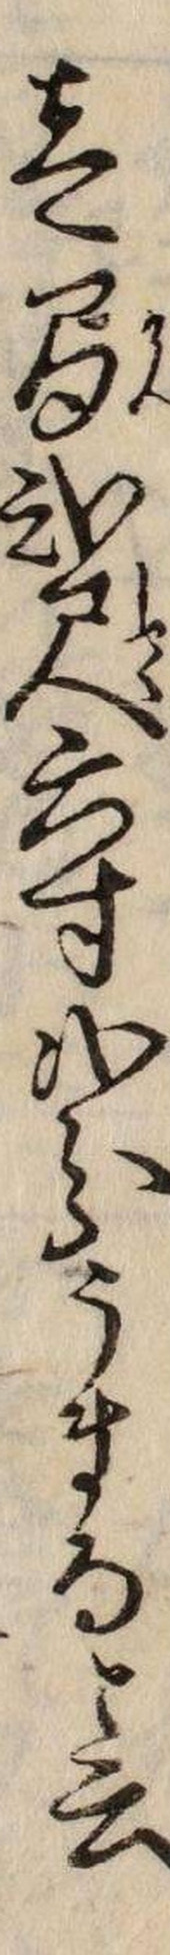壱間弐尺六寸弐分うまると云
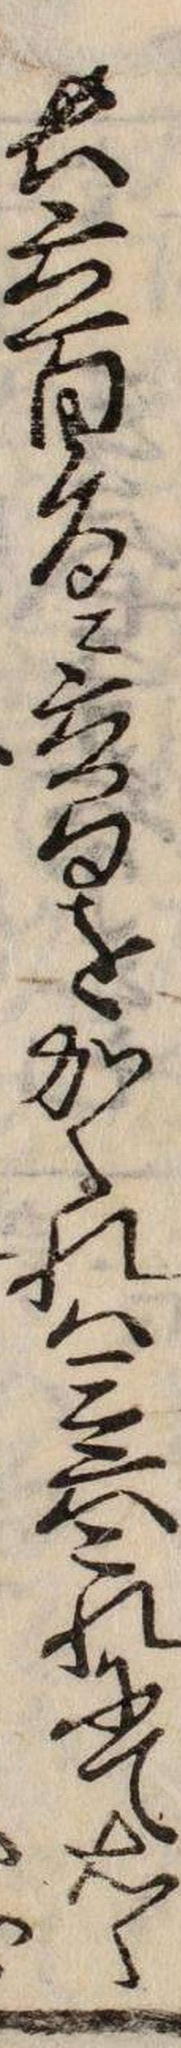長六百間に六間をかくれは三六これにて右之
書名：塵劫記（寛永11年自跋、京都府立京都学・歴彩館追貴8）
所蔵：京都府立京都学・歴彩館 国文学研究資料館
